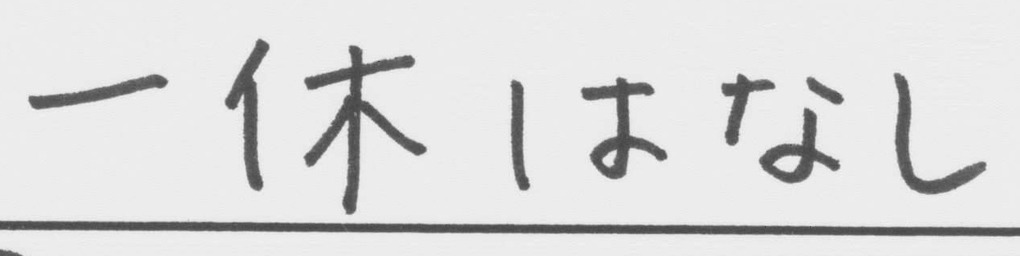一休はなし
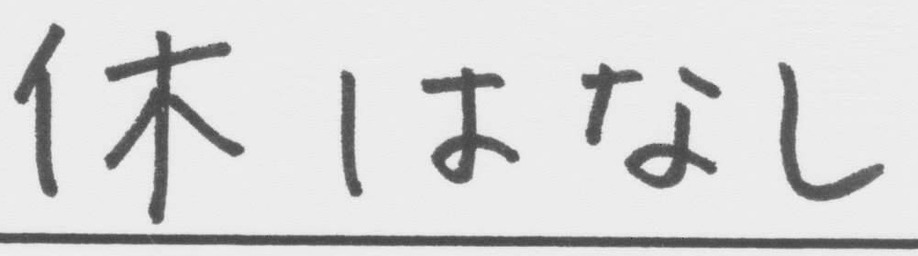一休はなし

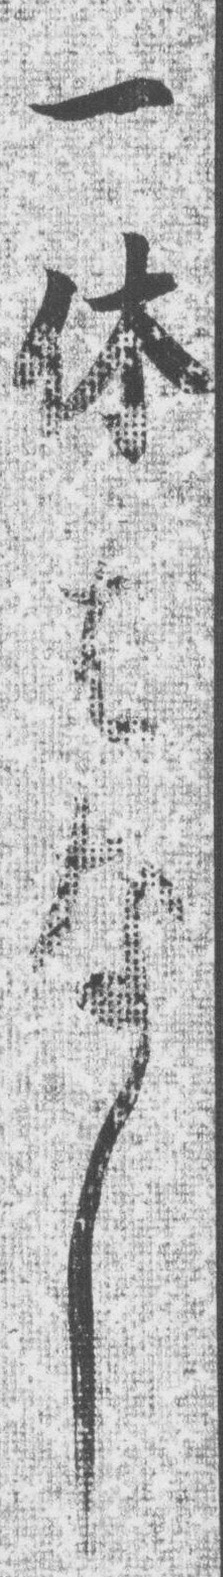一休はなし
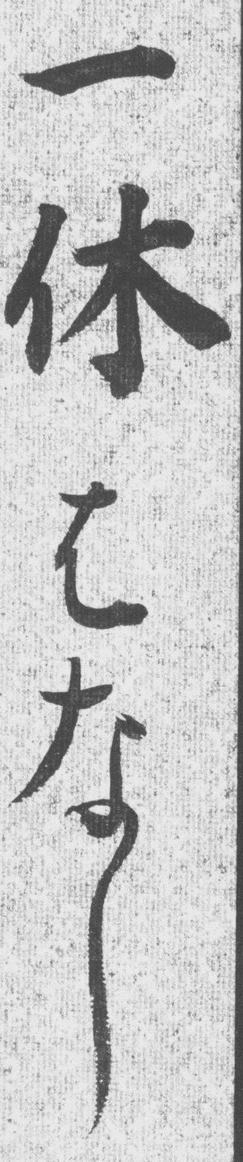一休はなし

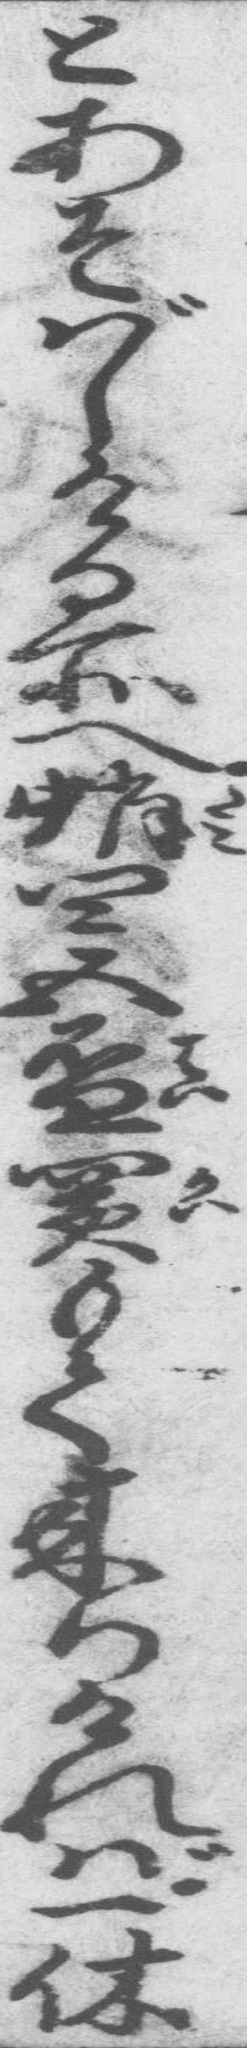とあそばしける所へ。蛸四五盃買もて来りければ。一休
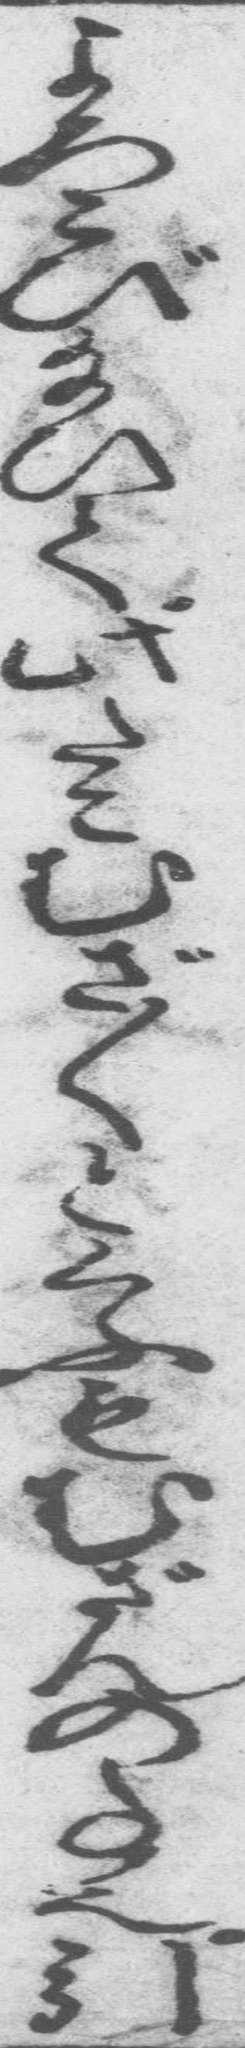よろこび給ひて。此たこむざ〳〵とくふもむざんの事也。引
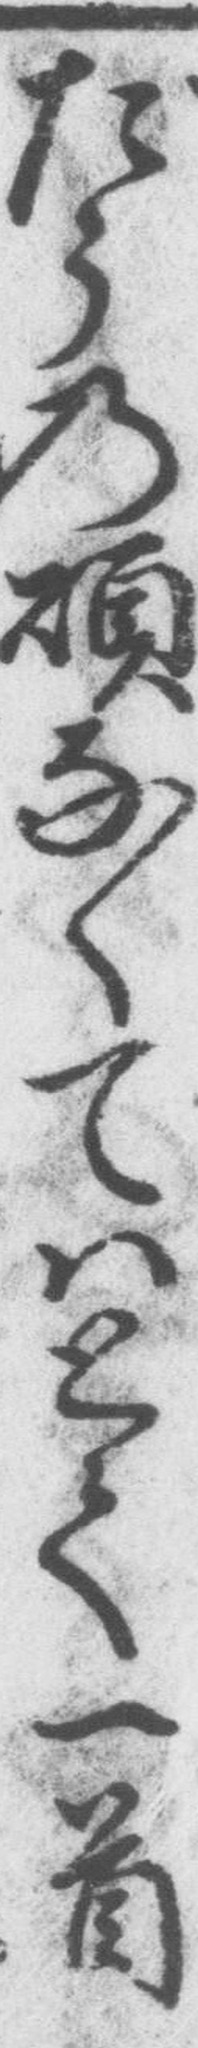だうの頌なくてはとて一首
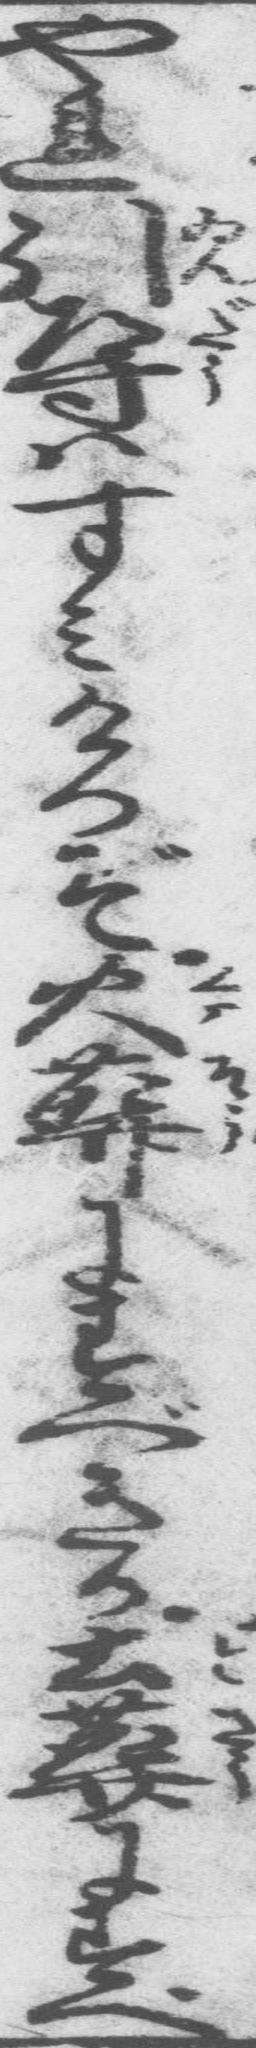やれ引導はすみけるぞ。火葬にすべきか。土葬にすべ
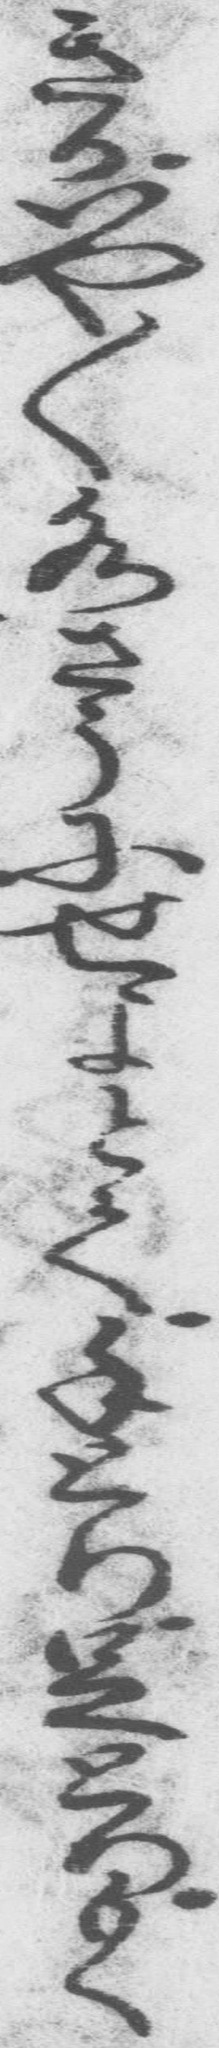きか。いや〳〵水さうにせよとて。手とり。足とり。もく
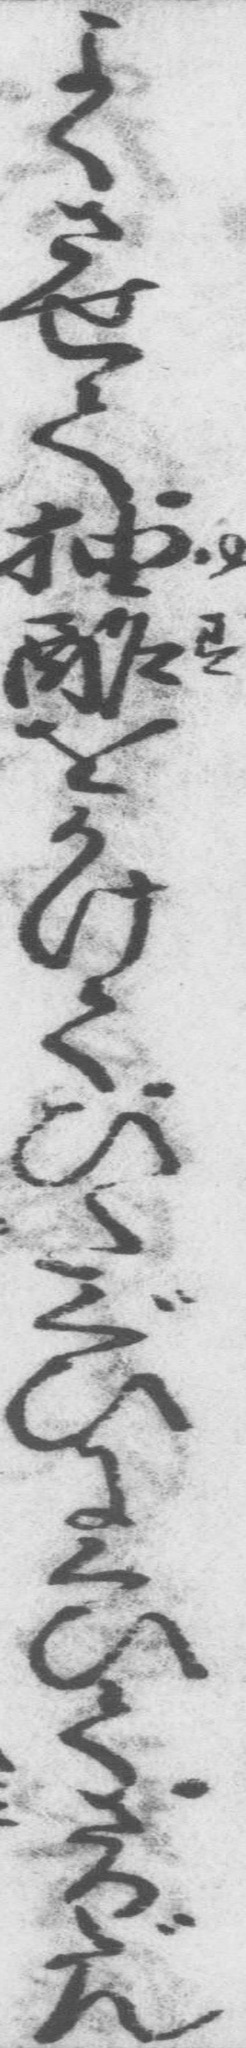よくさせて。柚酢をかけて。ひたぐひにくひて。さるだん
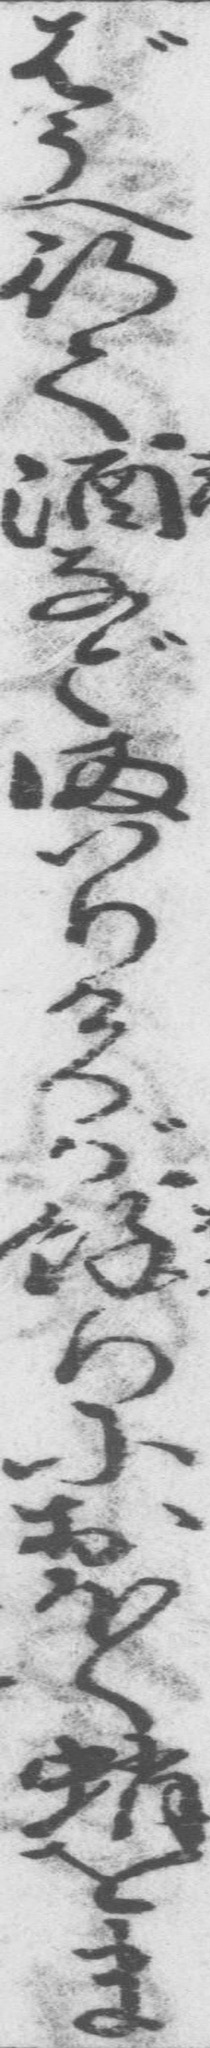ばうへ行く。酒などまいりけるが。余りにおほく蛸をま
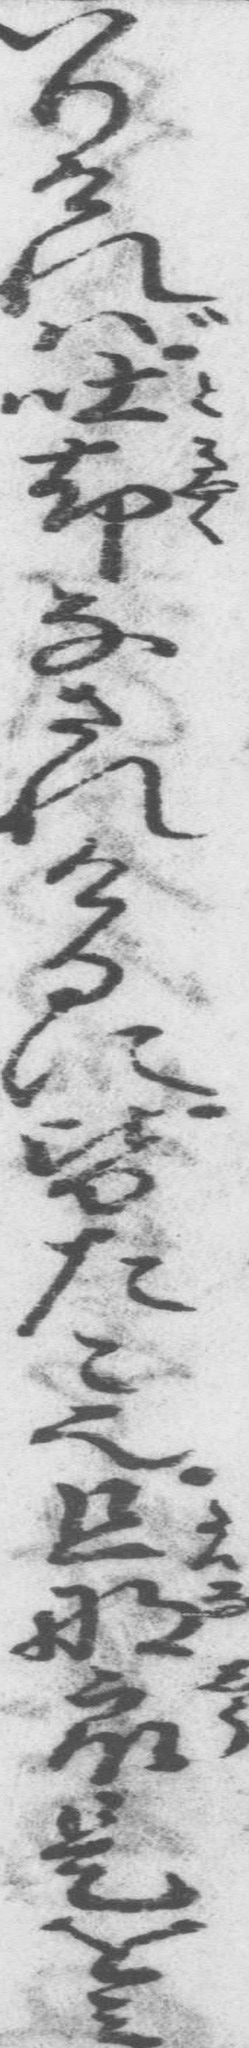いりければ吐却なされけるに。皆たこ也。旦那衆是をみ
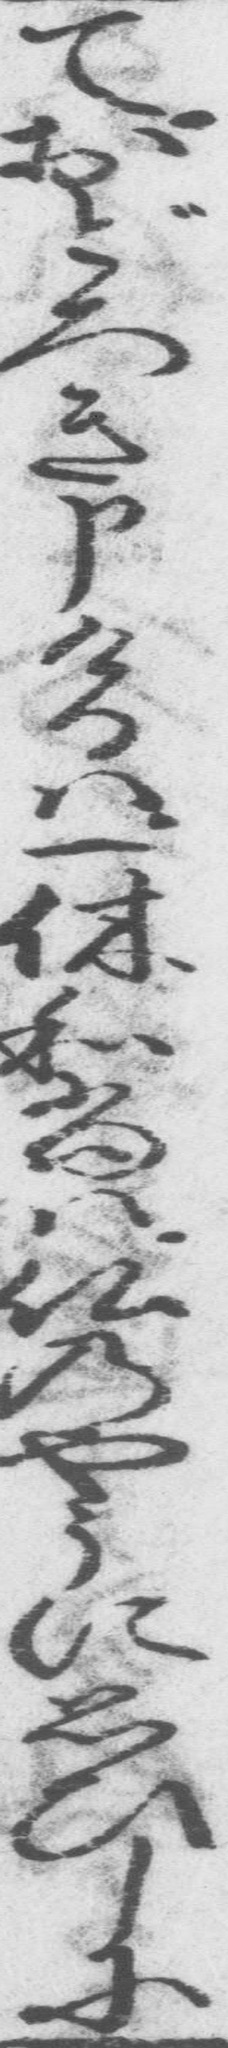て。おどろき申けるは。一休和尚は。仏のやうに思ひしに

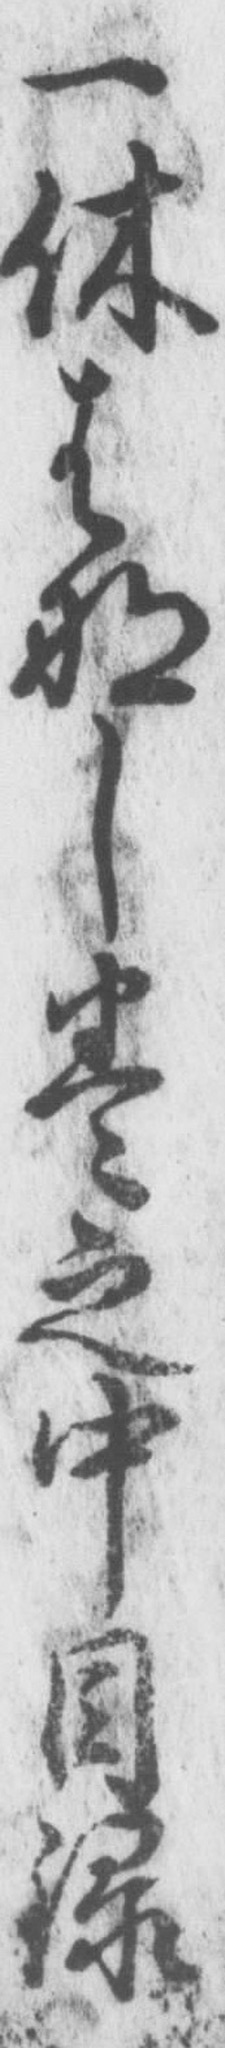一休はなし巻之中目録
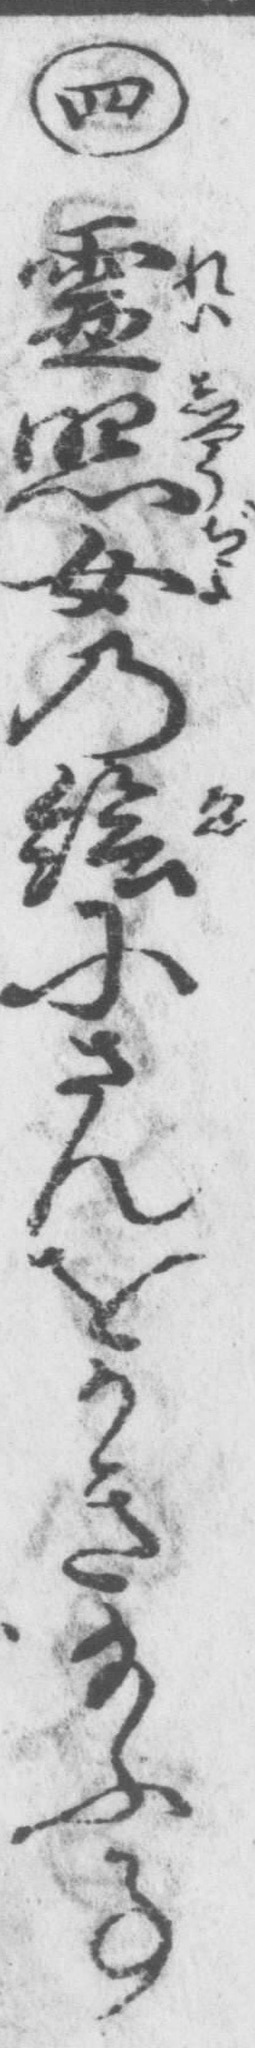四霊照女の絵にさんをかき給ふ事
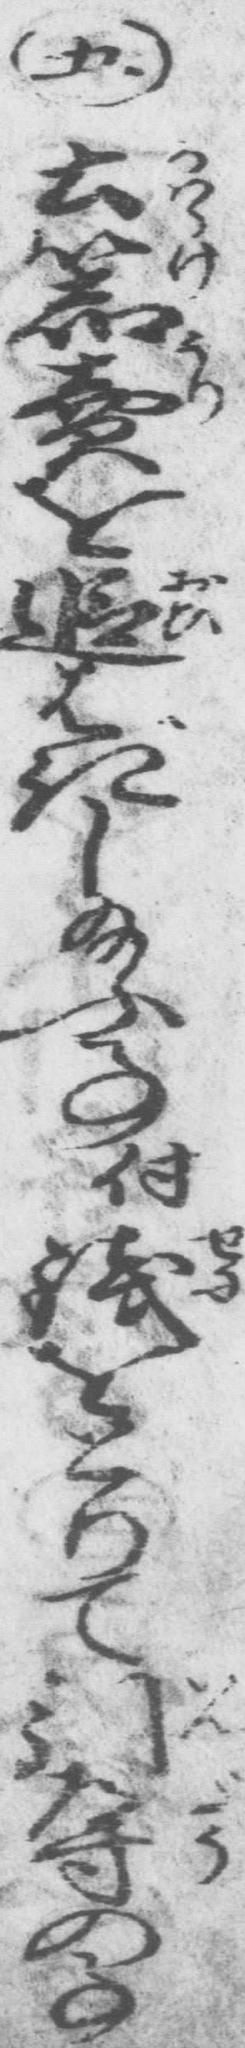五土器売を追はぎし給ふ事付銭をとりて引導の事
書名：一休はなし（元禄十三）
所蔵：大阪公立大学中百舌鳥図書館 国文学研究資料館
